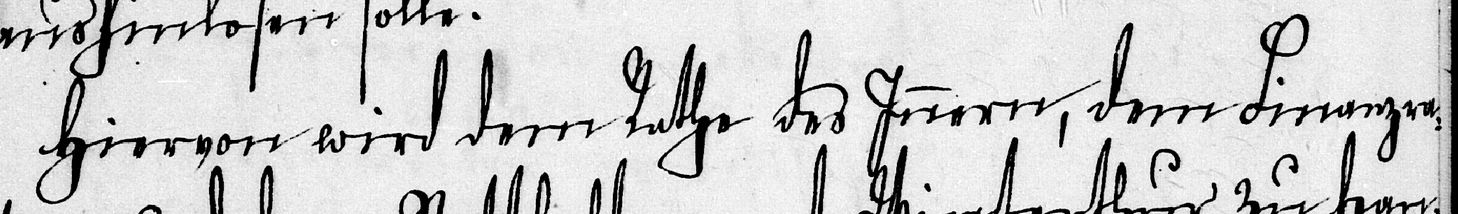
Hiervon wird dem Rathe des Innern, dem Finanzr¬
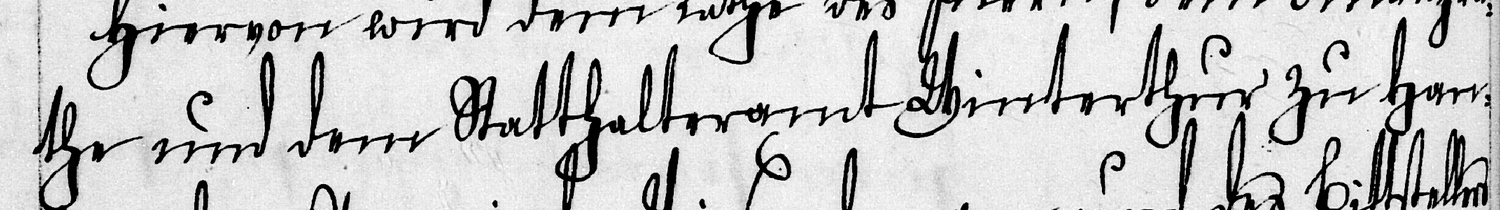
athe und dem Statthalteramt Winterthur zu Han¬
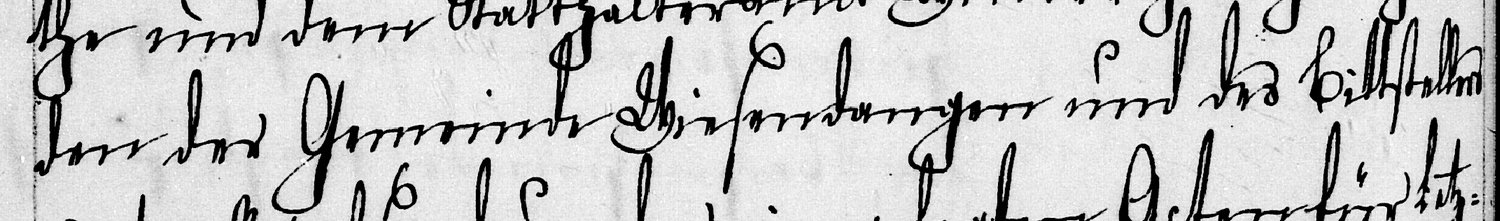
den der Gemeinde Wiesendangen und des Bittstel¬
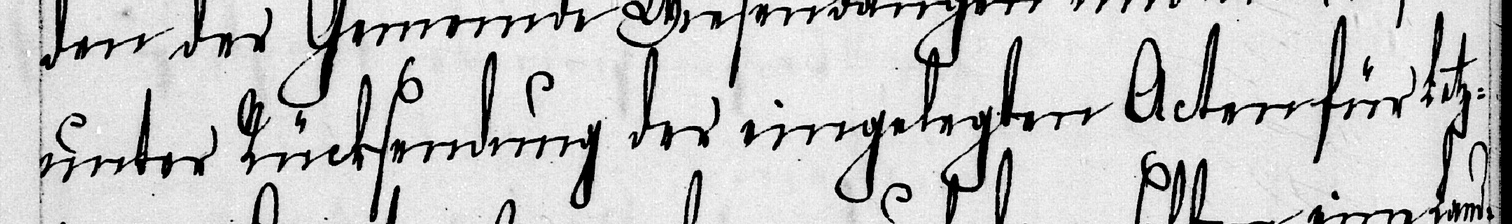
unter Rücksendung der eingelegten Acten für Let¬
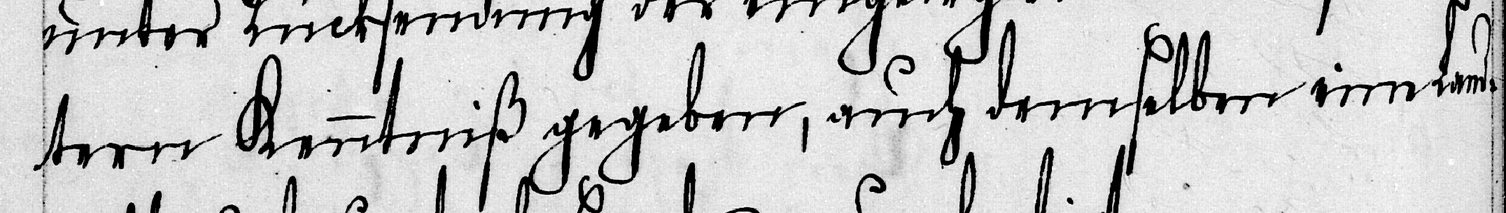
ztern Kenntniß gegeben, auch demselben eine
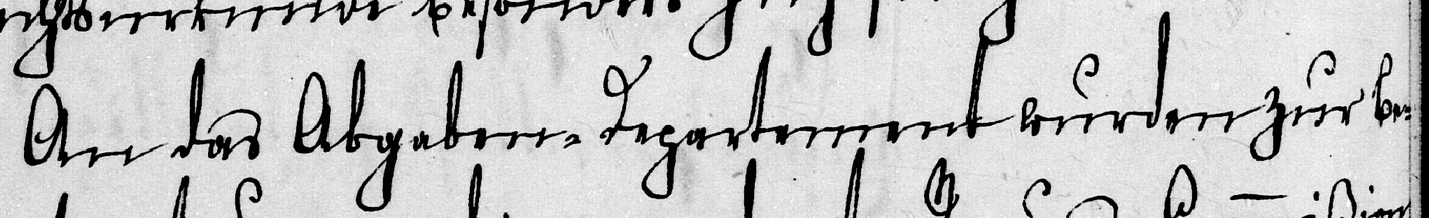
An das Abgaben-Departement wurden zur Be¬
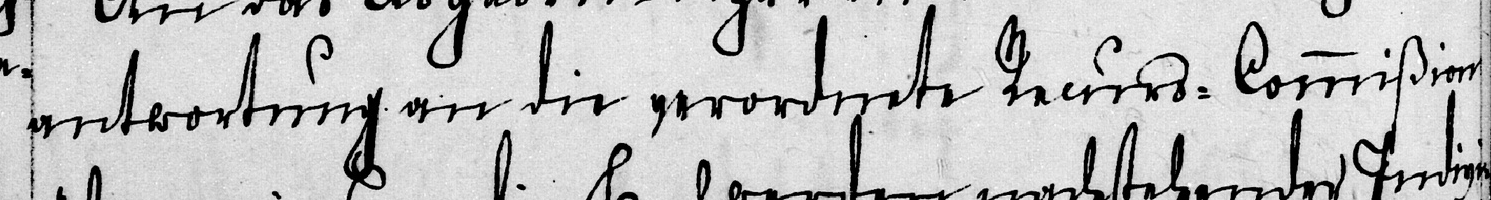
antwortung an die verordnete Recurs-Commißion
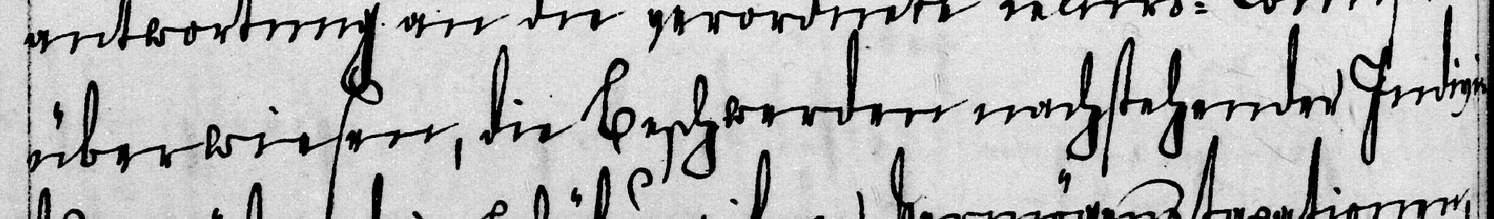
überwiesen, die Beschwerden nachstehender Indi¬
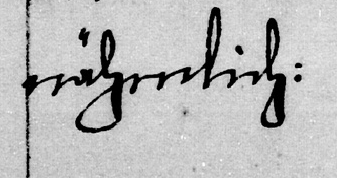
nähmlich:
